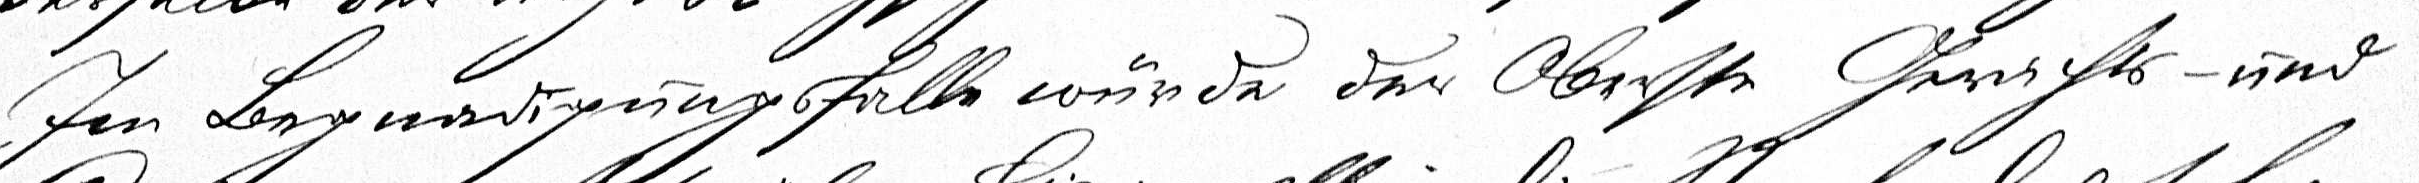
Im Benadigungsfalle würde der Oberste Gerichts- und
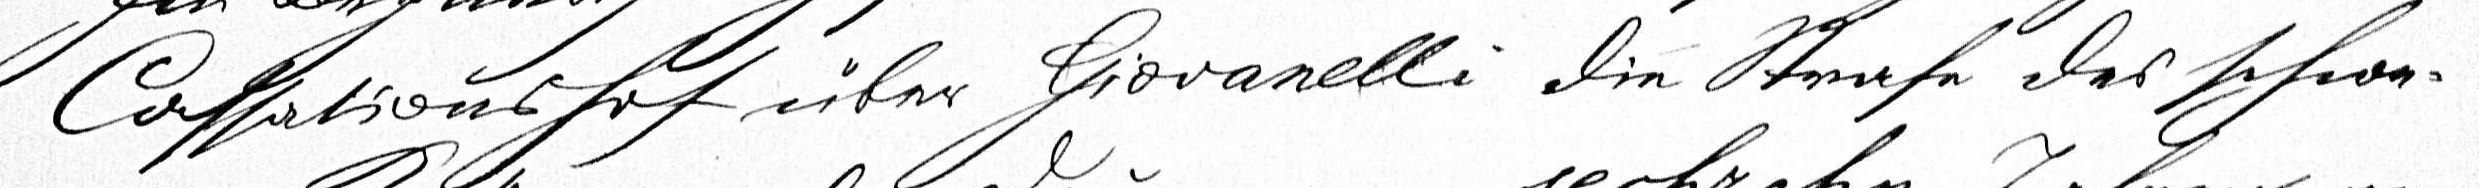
Cassationshof über Giovanelli die Strafe der schwa¬
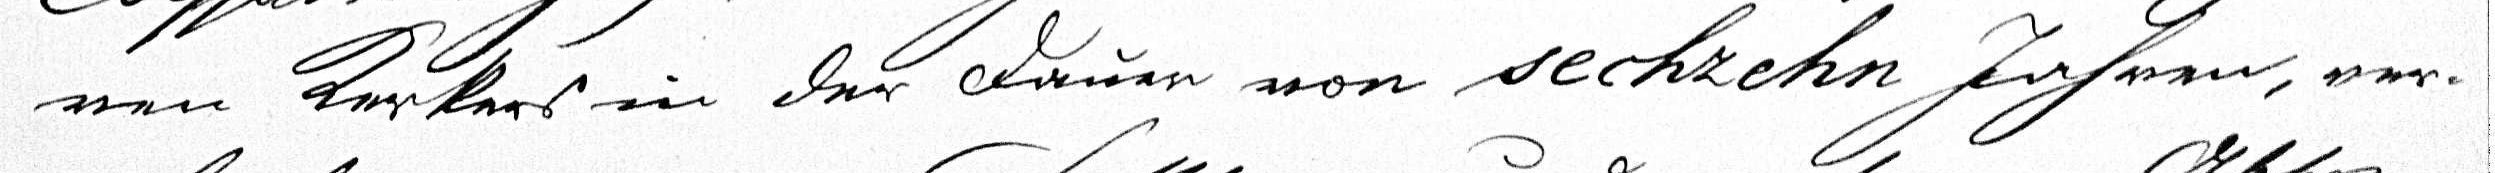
ren Kerkers in der Dauer von sechzehn Jahren, ver¬
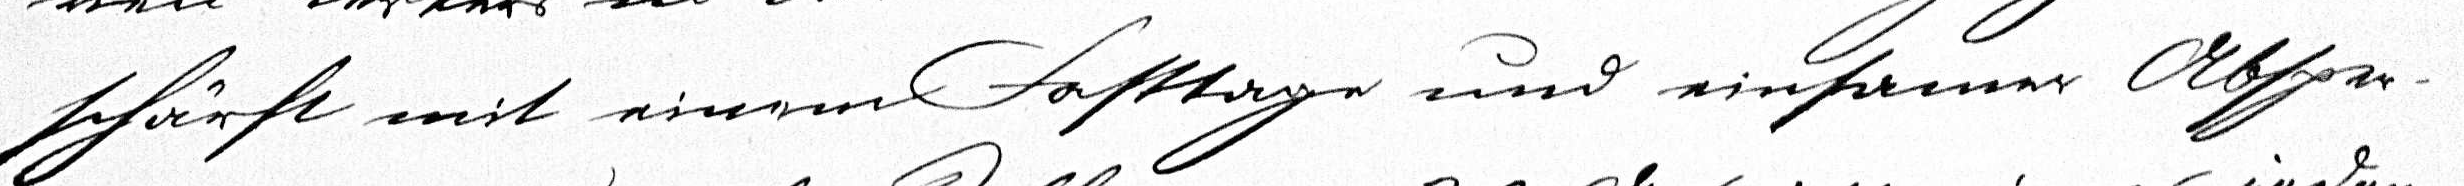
schärft mit einem Fasttage und einsamer Absper¬
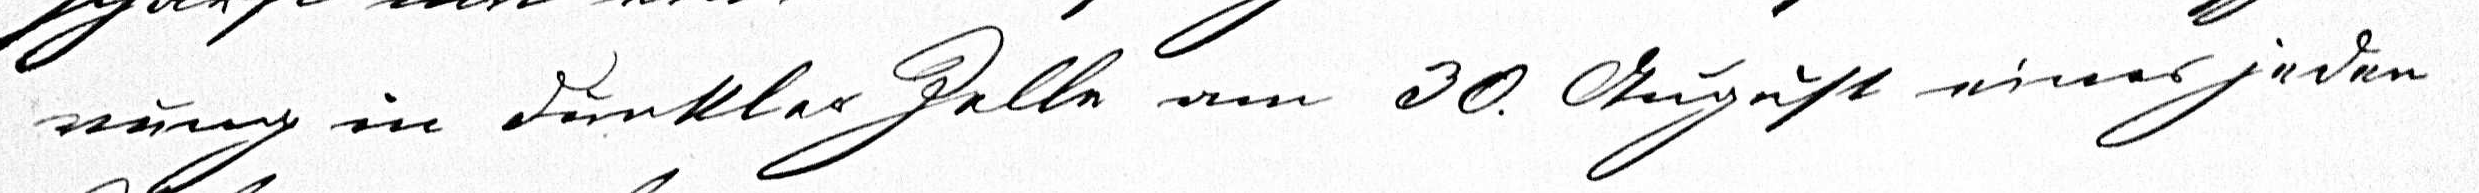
rung in dunkler Zelle am 30. August eines jeden
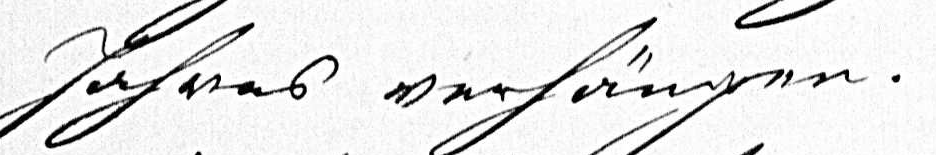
Jahres verhängen.
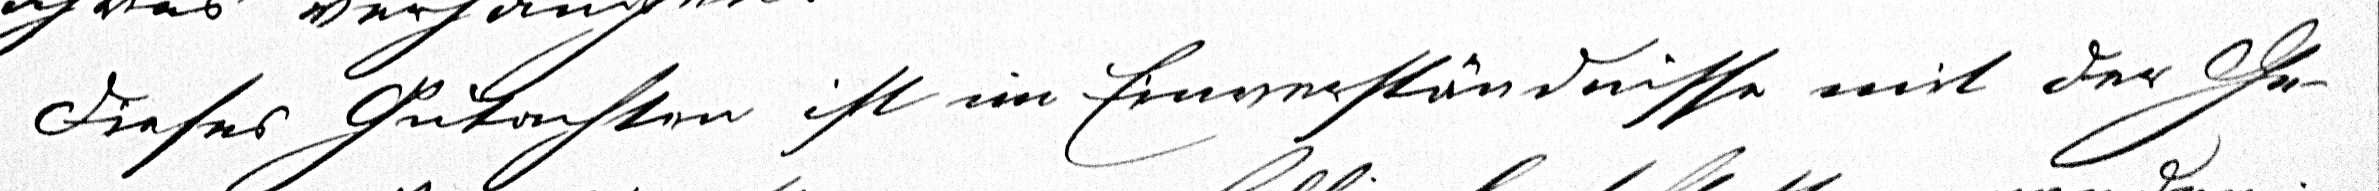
Dieses Gutachten ist im Einverständnisse mit der Ge¬
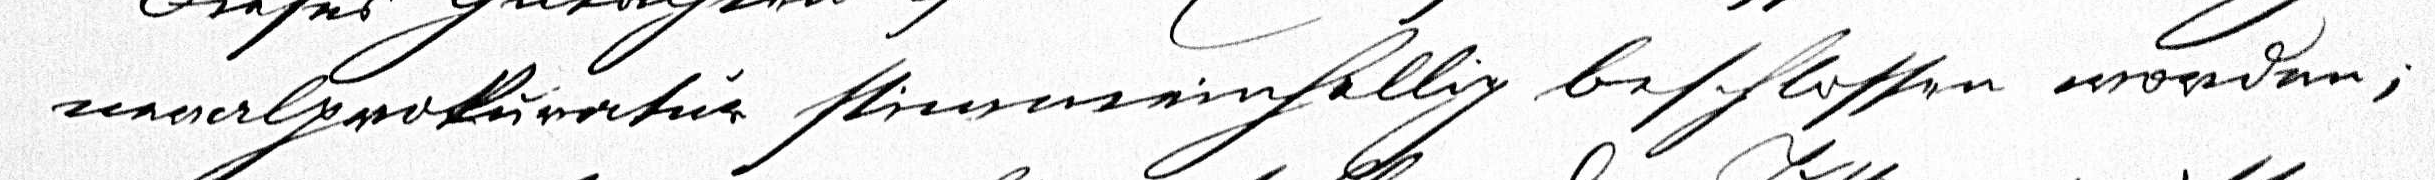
neralprokuratur stimmeinhellig beschlossen worden;
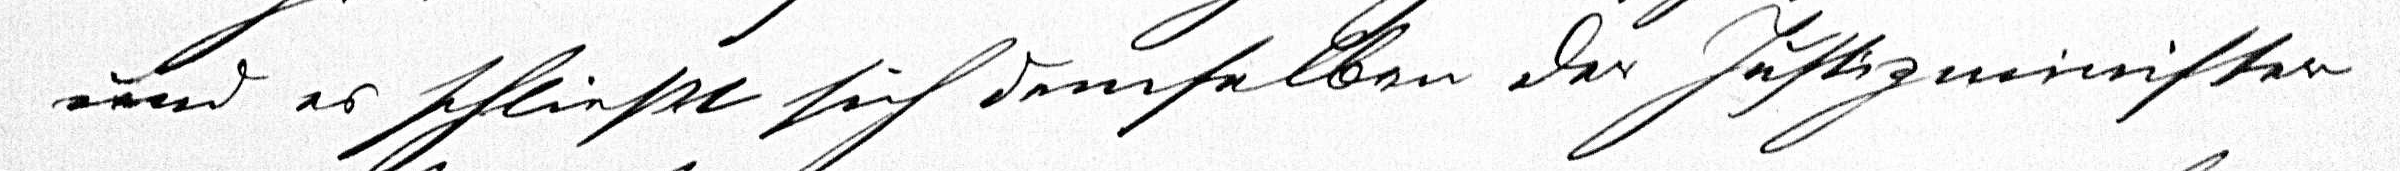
und es schließt sich demselben der Justizminister
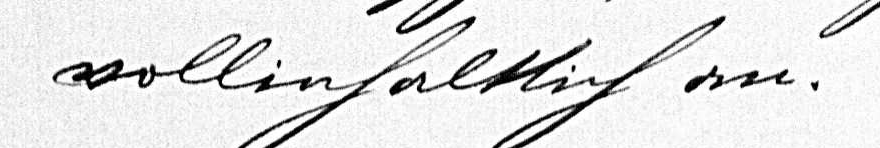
vollinhaltig an.
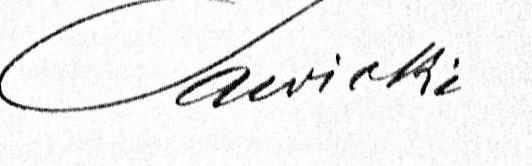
Sawicki
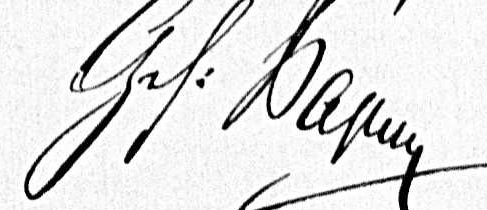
Ges. Papay
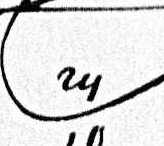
24
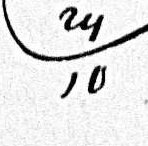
10
